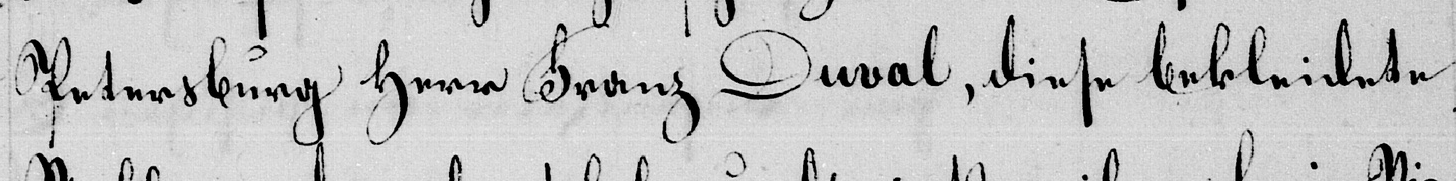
Petersburg Herr Franz Duval, diese bekleidete
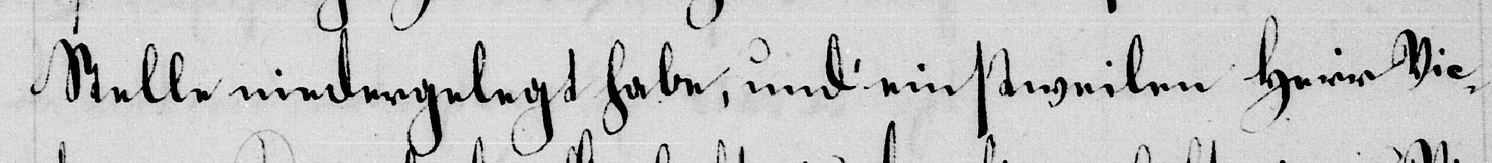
Stelle niedergelegt habe, und einstweilen Herr Vic¬
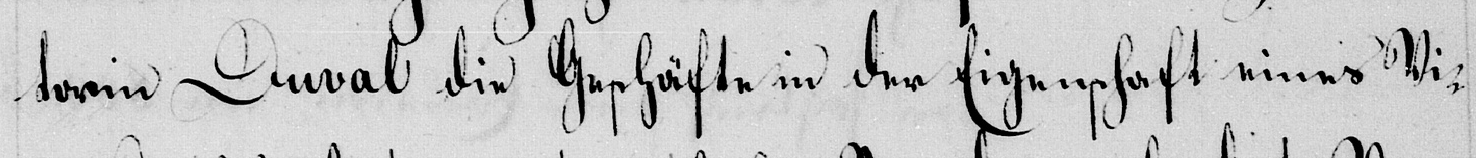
torin Duval die Geschäfte in der Eigenschaft eines Vi¬
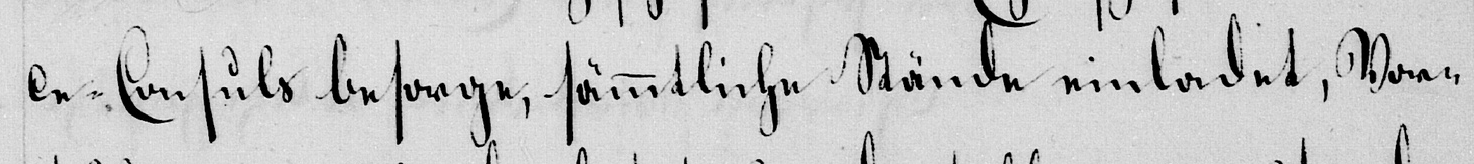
ce-Consuls besorge, sämmtliche Stände einladet, Vor¬
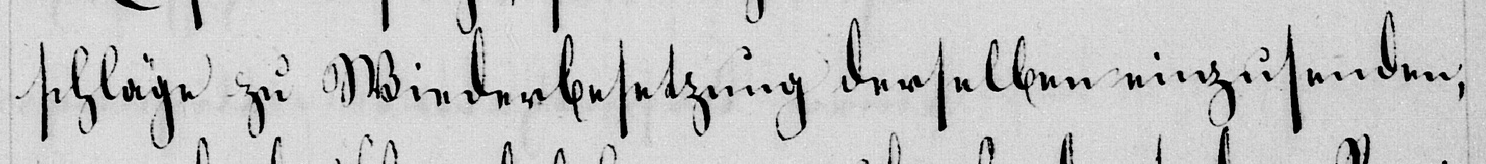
schläge zu Wiederbesetzung derselben einzusenden,
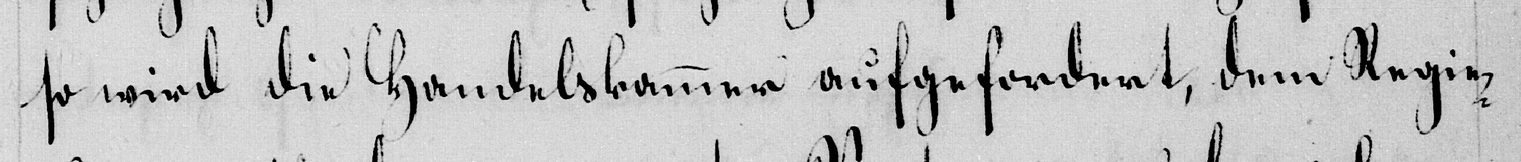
so wird die Handelskammer aufgefordert, dem Regie¬
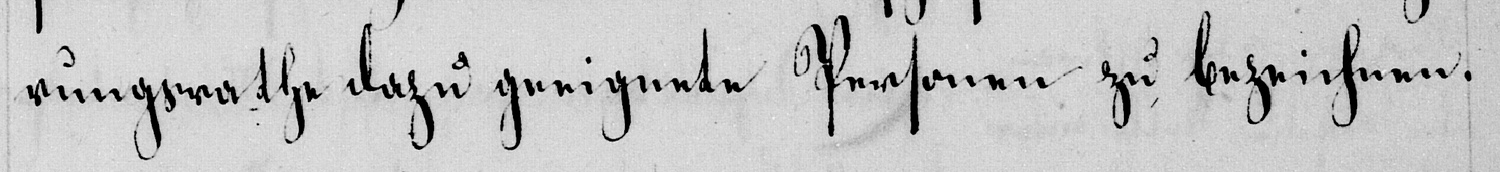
rungsrathe dazu geeignete Personen zu bezeichnen.
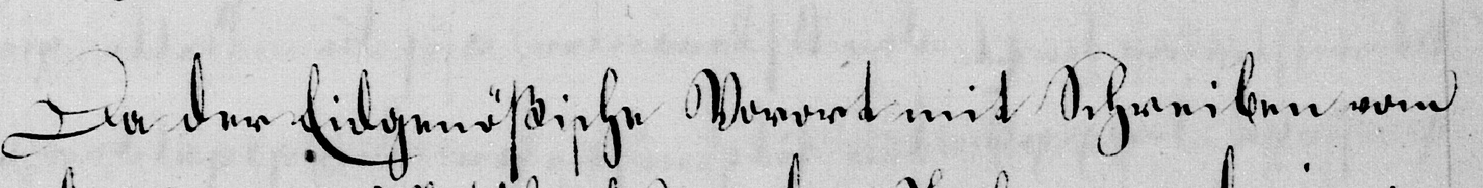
Da der Eidgenößische Vorort mit Schreiben vom
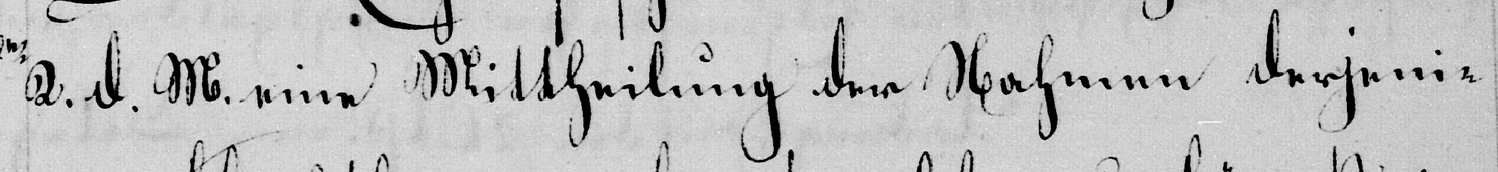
2. d. M. eine Mittheilung der Nahmen derjeni¬
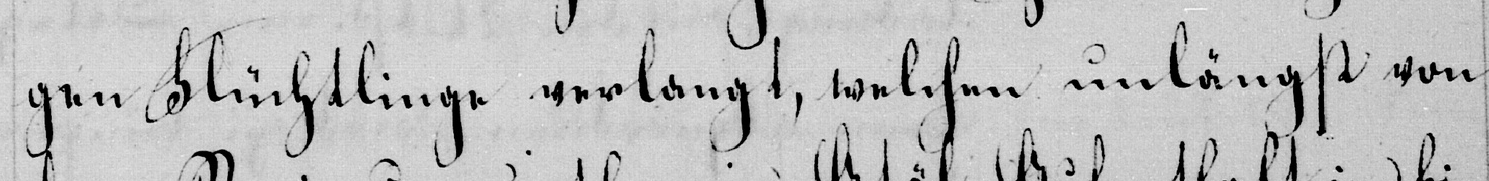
gen Flüchtlinge verlangt, welchen unlängst von
